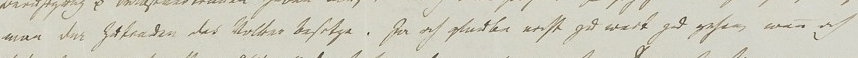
man das Zutrauen des Volkes besitze. Ja ich glaube nicht zu weit zu gehen, wenn ich
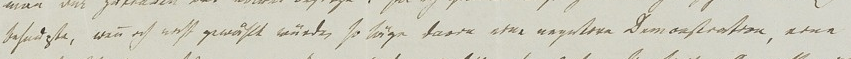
behaupte, wenn ich nicht gewählt würde, so läge darin eine negative Demonstration, eine
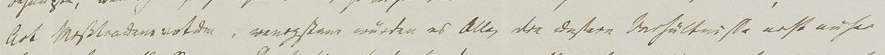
Art Mißtrauensvotum, wenigstens würden es Alle, die unsere Verhältnisse nicht näher
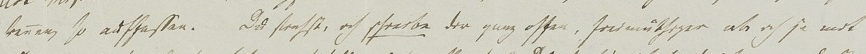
kennen, so auffassen. Du siehst, ich schreibe Dir ganz offen, freimüthiger als ich je mit
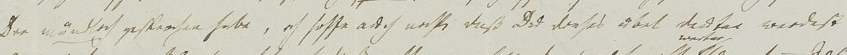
Dir mündlich gesprochen habe, ich hoffe auch nicht, daß Du dieses übel deuten werdest.
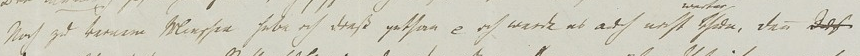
Noch zu keinem Menschen habe ich dieß gethan & ich werde es auch nicht weiter thun, denn das
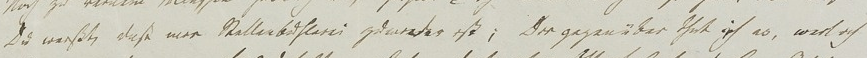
Du weißt, daß mir Stellenbuhlerei zuwieder ist; Dir gegenüber that ich es, weil ich
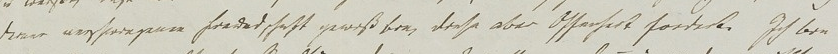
Deiner verschwiegenen Freundschaft gewiß bin, diese aber Offenheit fordert. Ich bin
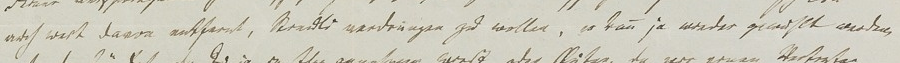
auch weit davon entfernt, Streuli verdrängen zu wollen, er kann ja wieder gewählt werden,
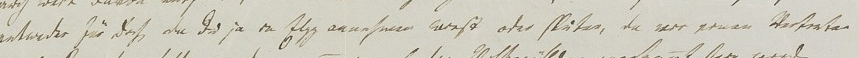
entweder für Dich, da Du ja in Elgg annehmen wirst oder später, da wir einen Vertreter
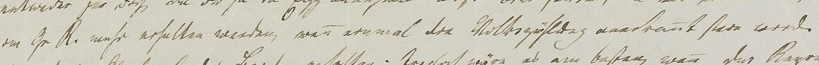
im GrR. mehr erhalten werden, wenn einmal die Volkszählung anerkannt sein wird.
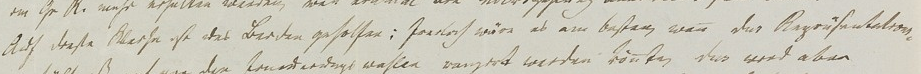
Auf diese Weise ist uns Beiden geholfen; freilich wäre es am besten, wenn das Repräsentations-
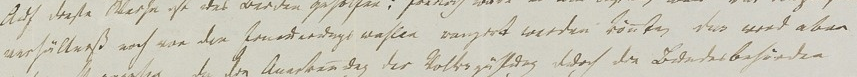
verhältniß noch vor den Erneuerungswahlen rangirt werden könnte, das wird aber
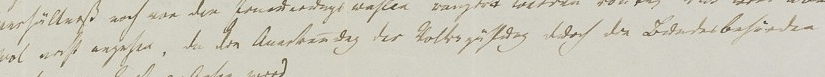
wol nicht angehen, da die Anerkennung der Volkszählung durch die Bundesbehörden
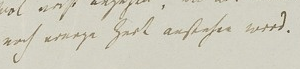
noch einige Zeit anstehen wird.
